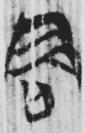命
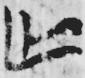亡（無）
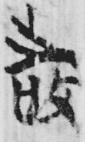○（時）
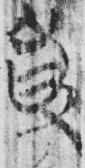事
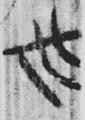必
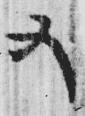又（有）
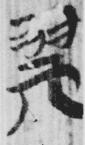○（期）
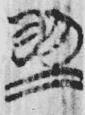則（則）
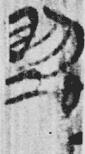惻（賊）
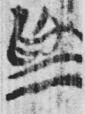爲
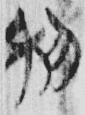利（利）
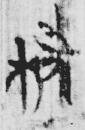○（枉）
